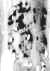○（食）
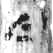㠯（以）
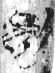○（食）
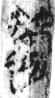廪
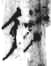凥（居）
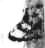西
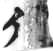北
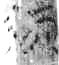凥（居）
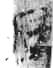是
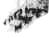室
